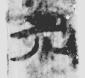亓
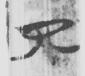四
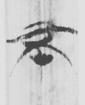不
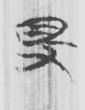𠭁
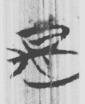是
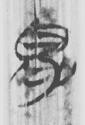{胃刀}
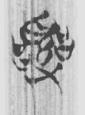𠧏（亂）
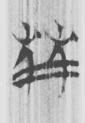{艸并}
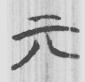亓
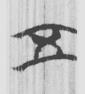五
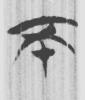不
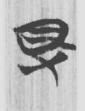𠭁
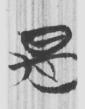是
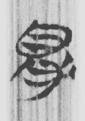{胃刀}
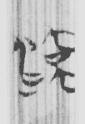流
